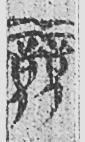競
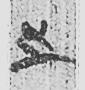之
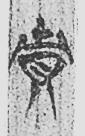賈
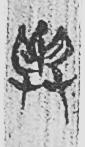與
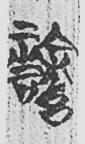{巫口余呂}
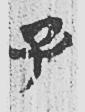子
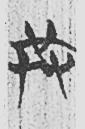共
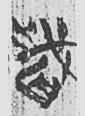{止頁戈}
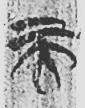而
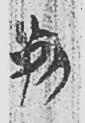死
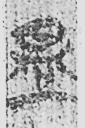昷
